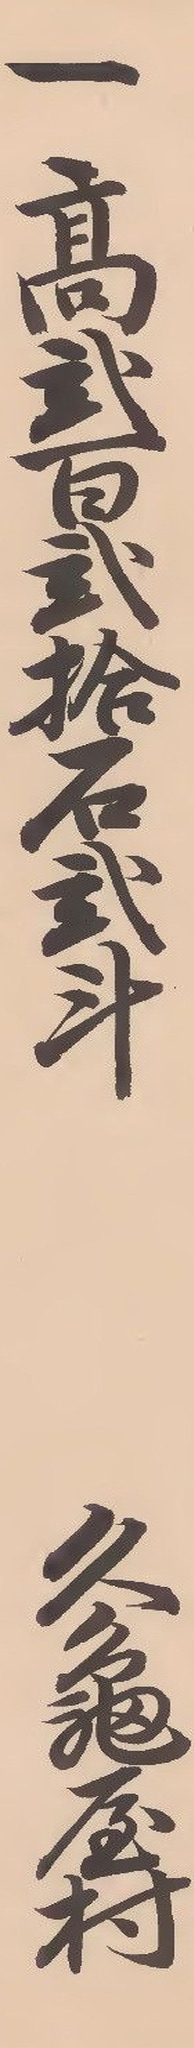一高弐百弐拾石弐斗久亀屋村
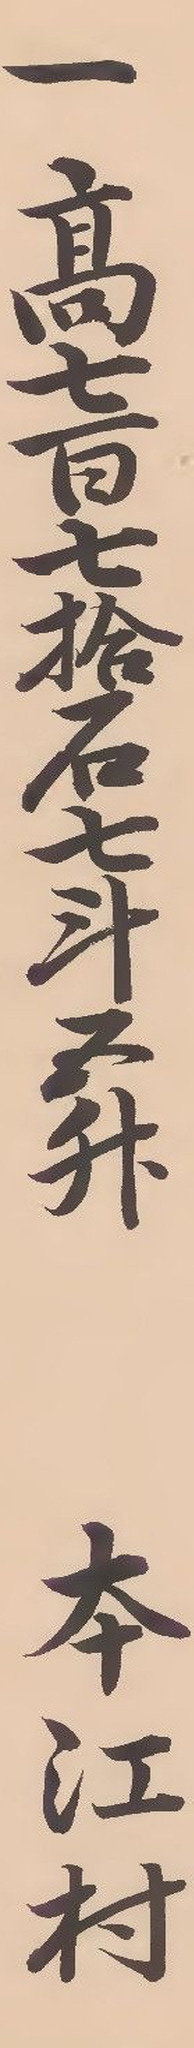一高七百七拾石七斗五升本江村

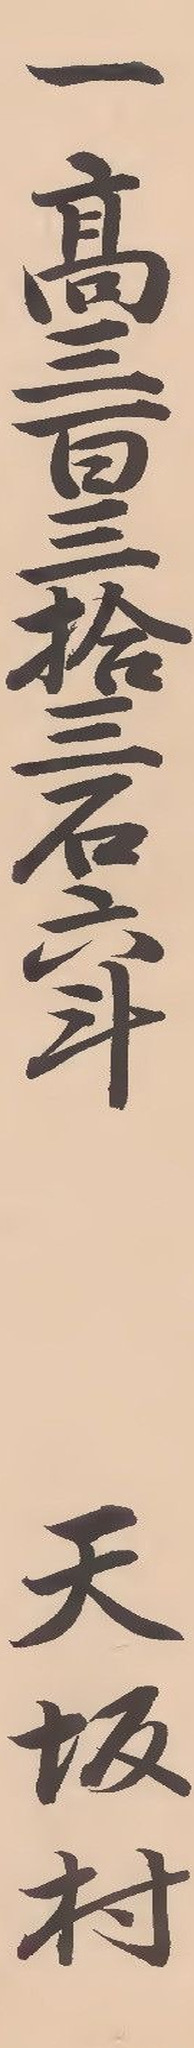一高三百三拾三石六斗天坂村
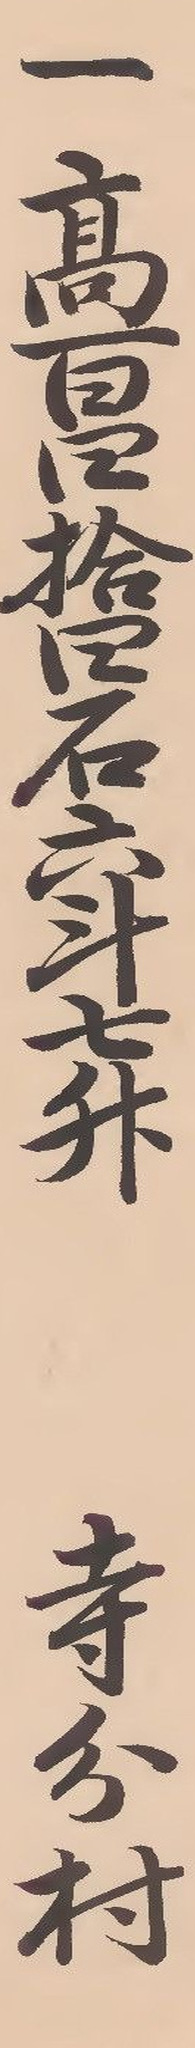一高百四拾四石六斗七升寺分村
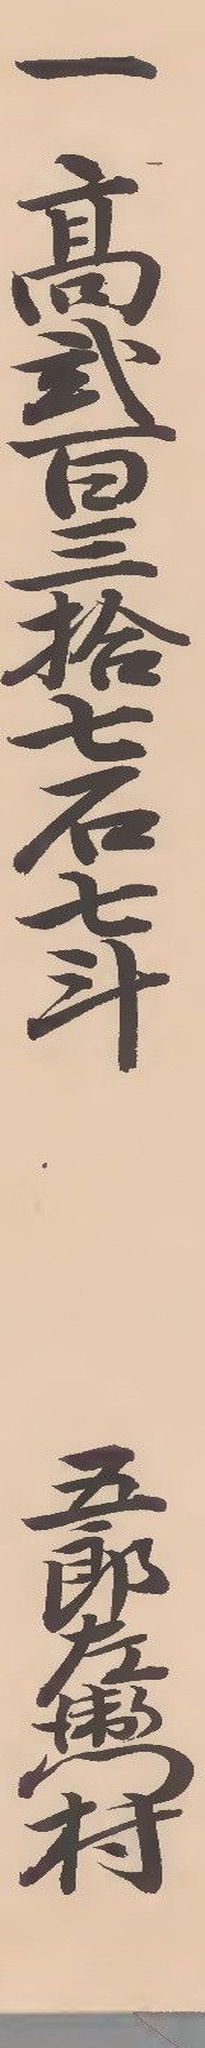一高弐百三拾七石七斗五郎左衛門村
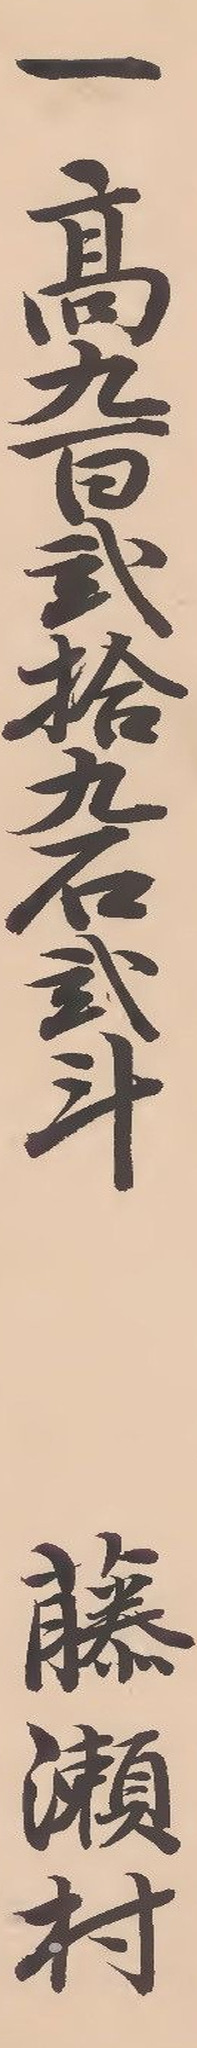一高九百弐拾九石弐斗藤瀬村
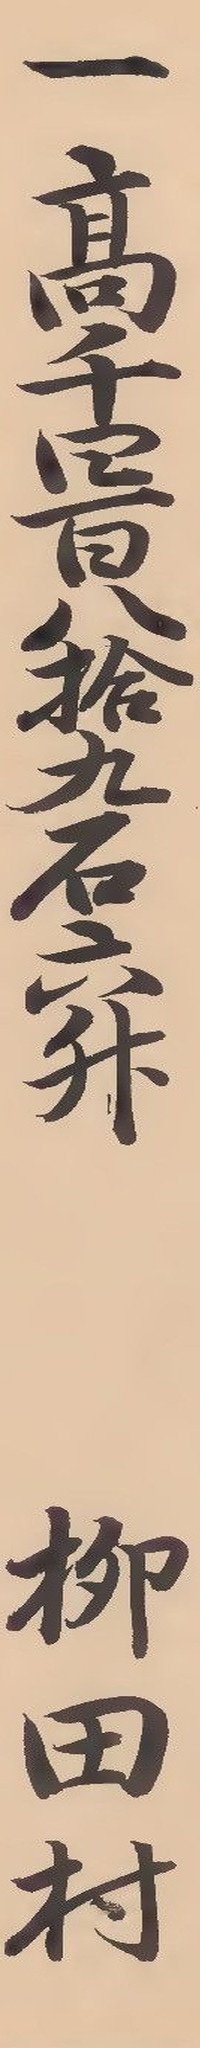一高千四百八拾九石六升柳田村
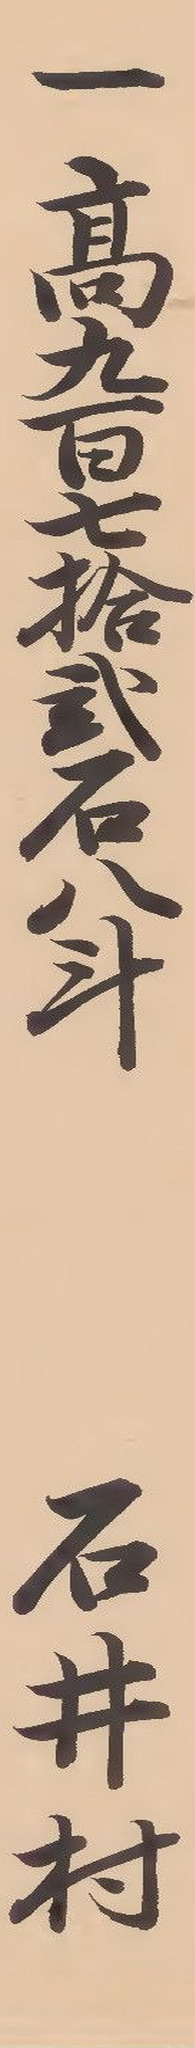一高九百七拾弐石八斗石井村

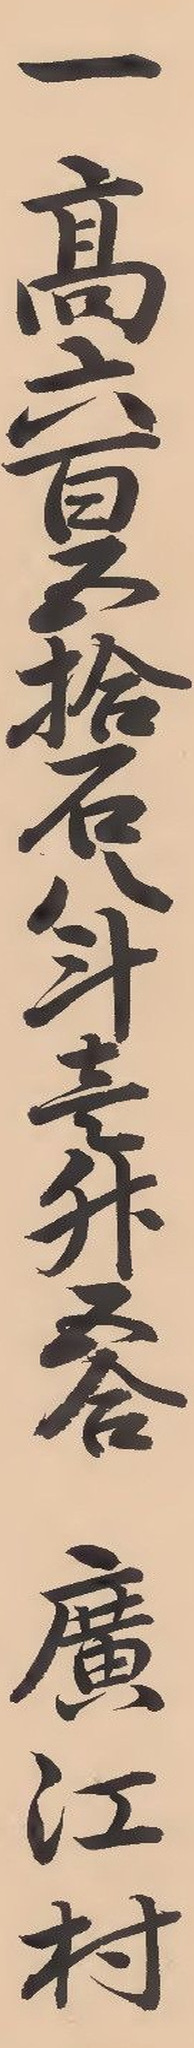一高六百五拾石八斗壱升五合広江村
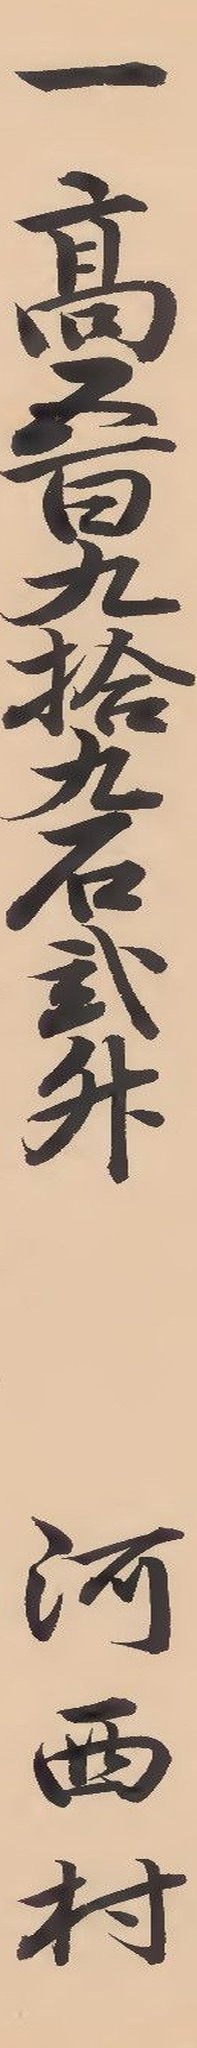一高五百九拾九石弐升河西村
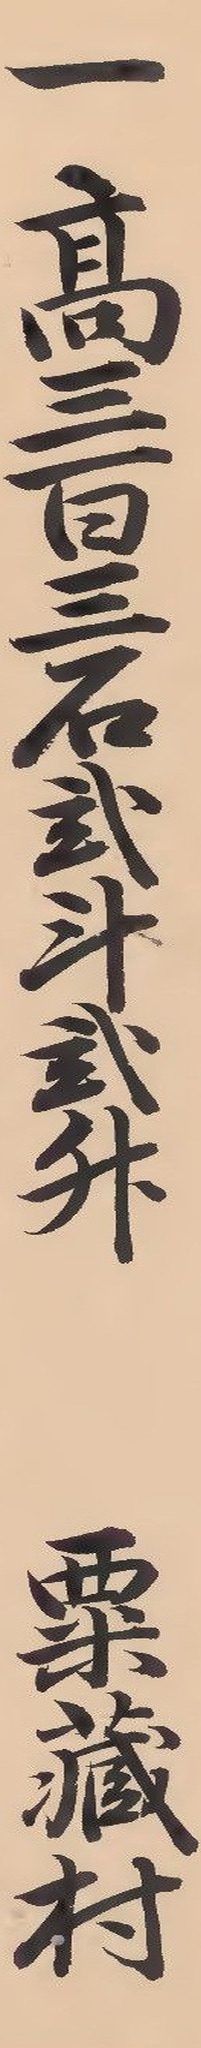一高三百三石弐斗弐升粟蔵村
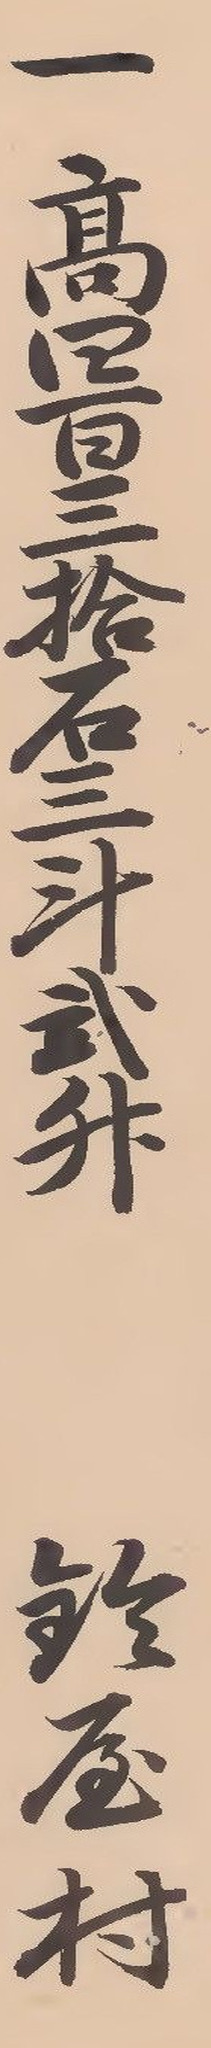一高四百三拾石三斗弐升鈴屋村
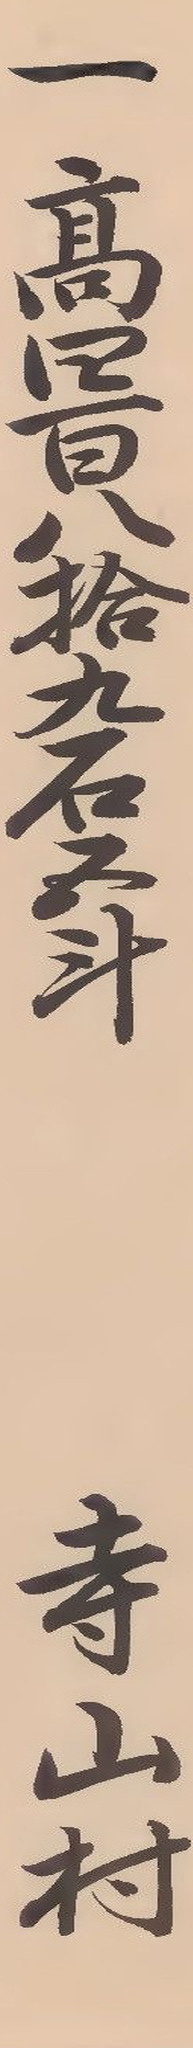一高四百八拾九石五斗寺山村
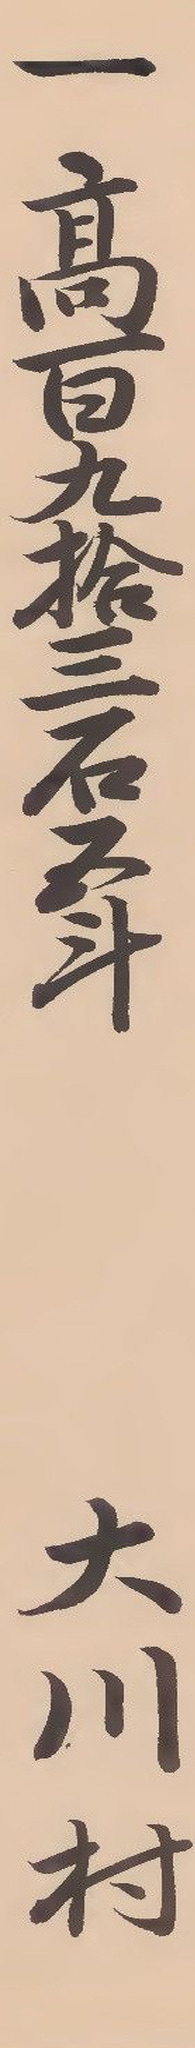一高百九拾三石五斗大川村
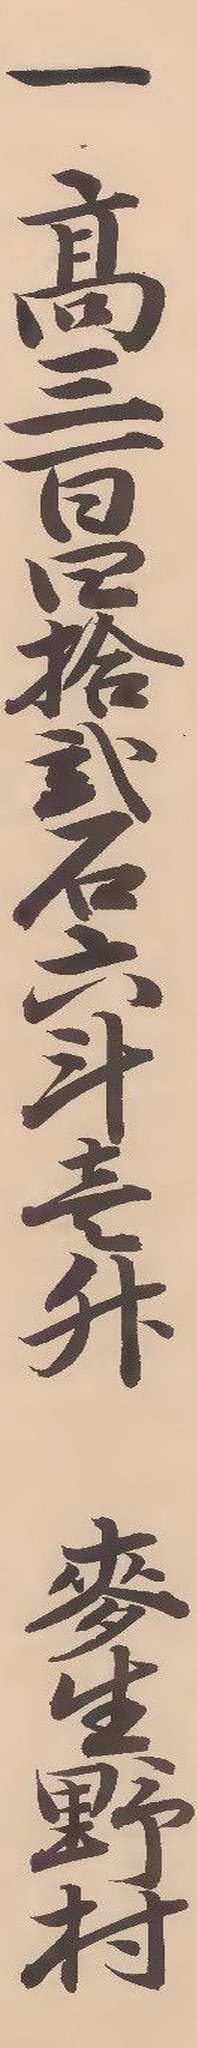一高三百四拾弐石六斗壱升麦生野村

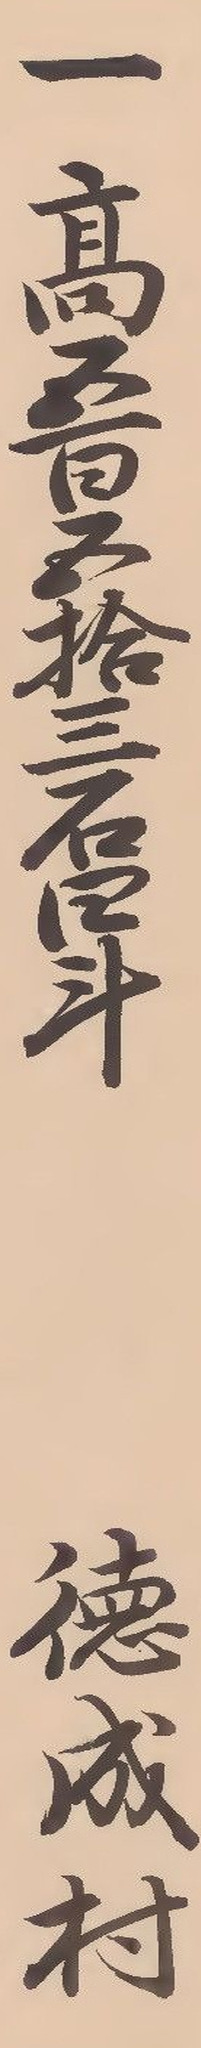一高五百五拾三石四斗徳成村
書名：能登国郷帳
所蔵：国立公文書館 National Archives of Japan
